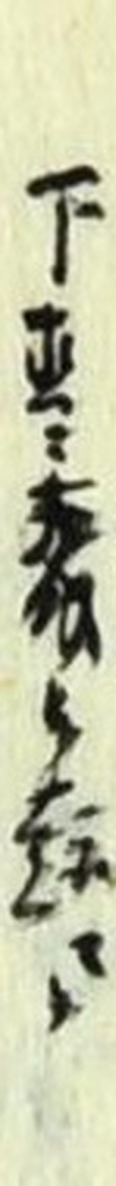下直ニ相成候趣ニ候
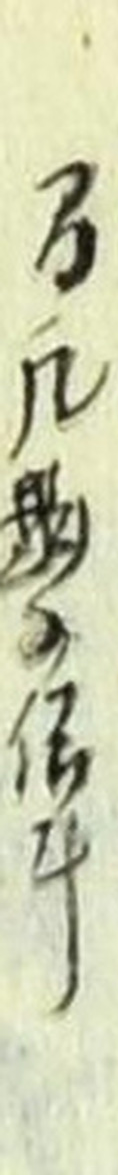間凡千俵計
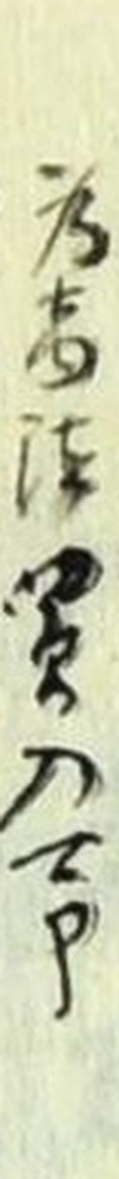為商談買入可申
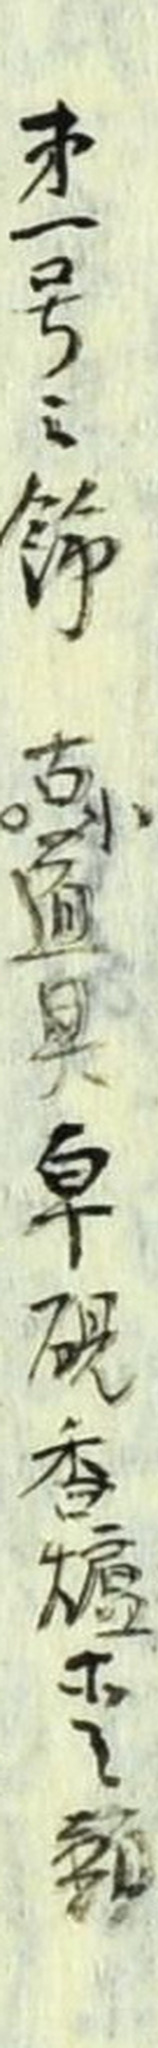第一号之飾古小道具卓硯香炉等之類
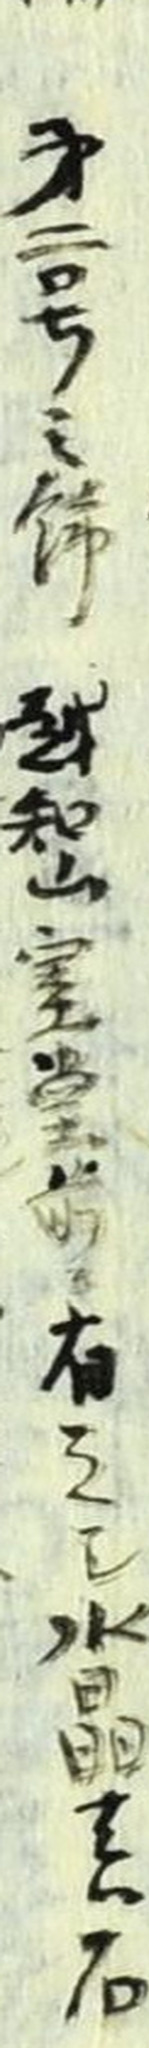第二号之飾越知山室堂止町ニ有之候水晶真石
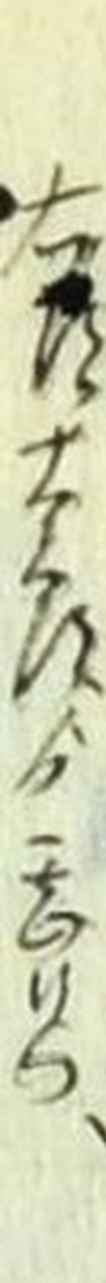右道太郎ゟ甚左衛門へ
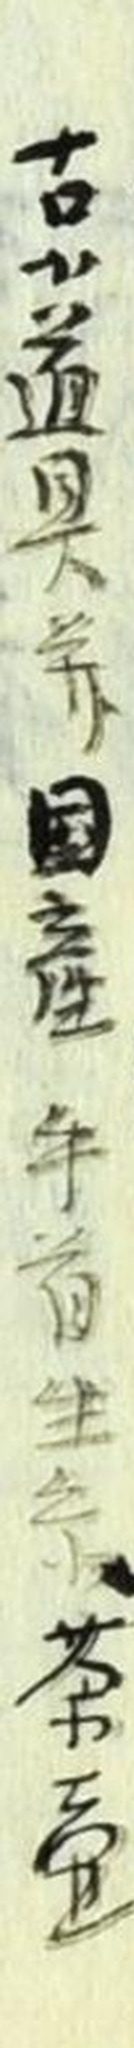古小道具幷国産牛首生糸茶壺
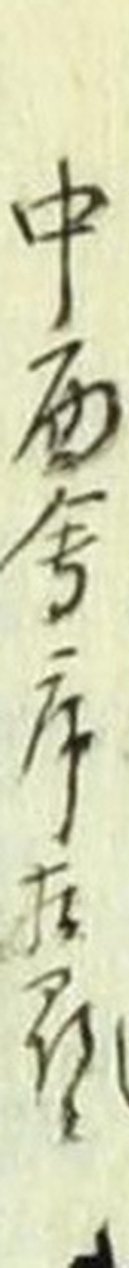中面会序相尋候
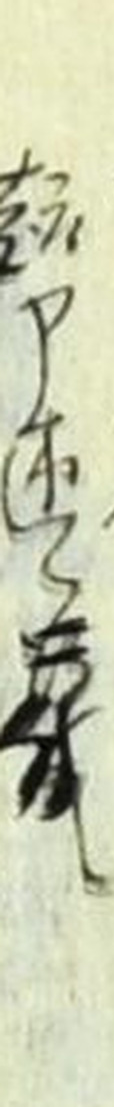趣申述候ニ付
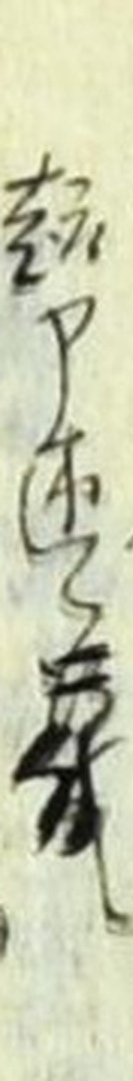趣申述候ニ付
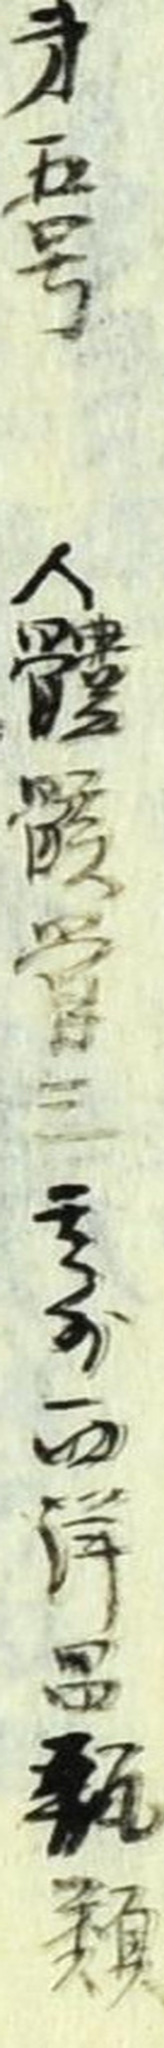第五号人体骸骨三其外西洋品瓶類
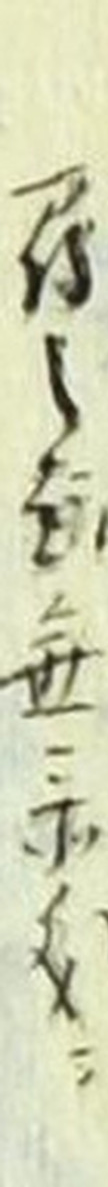尋之趣無忝義ニ
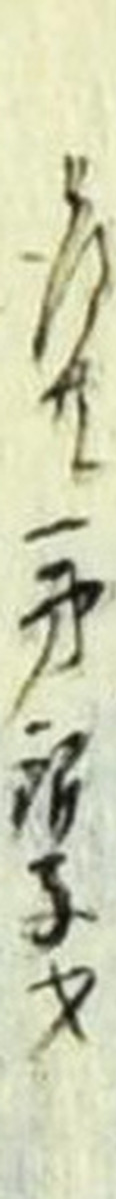候得共一第銀子才
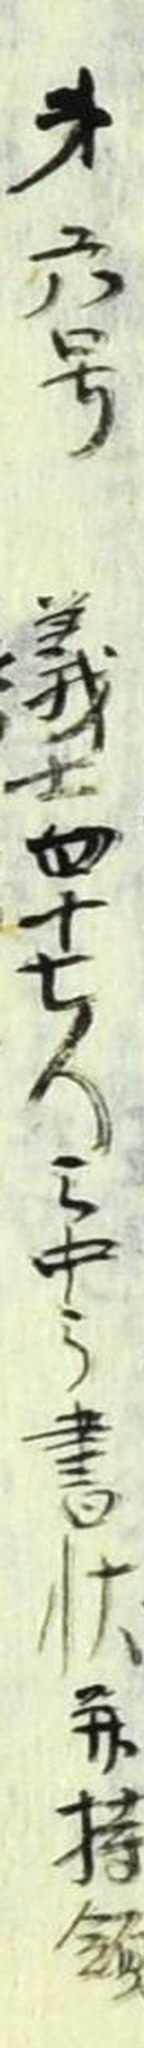第六号義士四十七人之中之書状幷持領
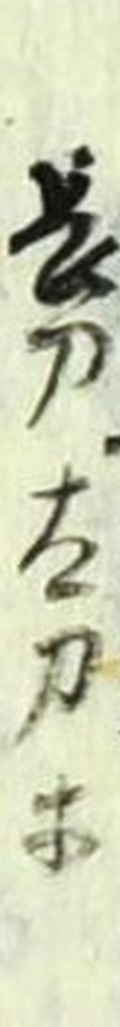長刀太刀等
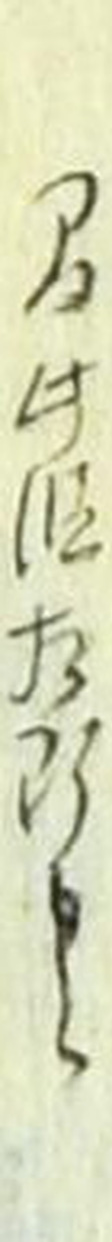間此段相断申候
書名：（日記）
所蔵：福井県文書館 Fukui Prefectural Archives
